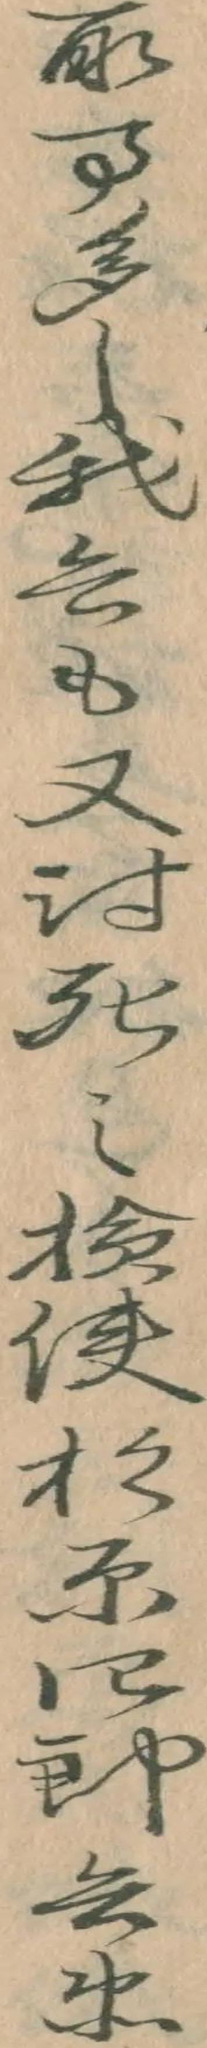取事多し我兵も又討死之検使杉原四郎兵衛

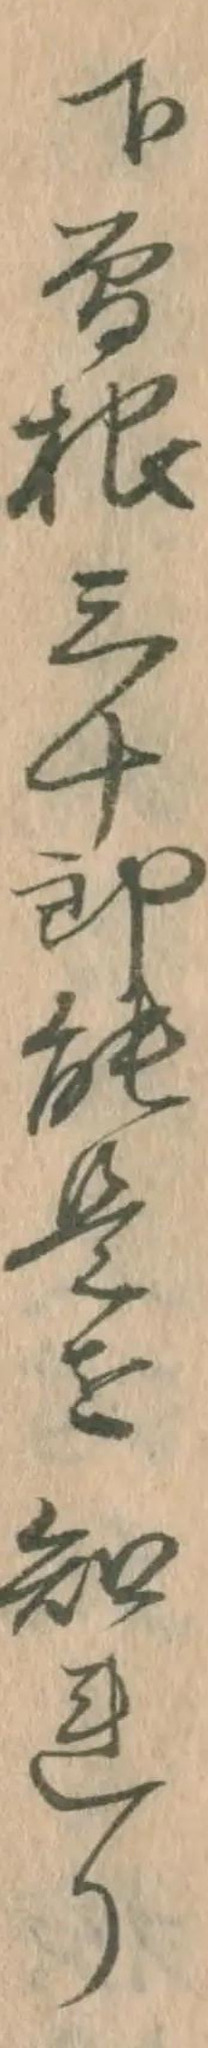下曽根三十郎能是を知連り
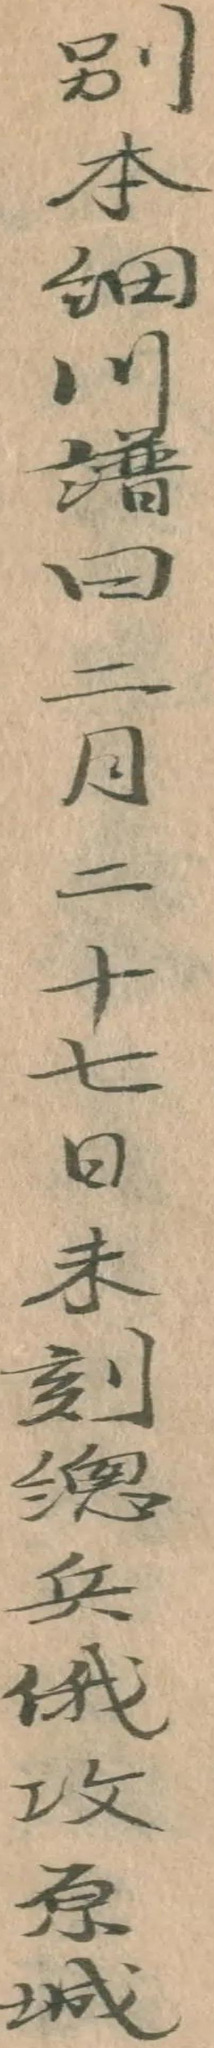別本細川譜曰二月二十七日未刻総兵俄攻原城
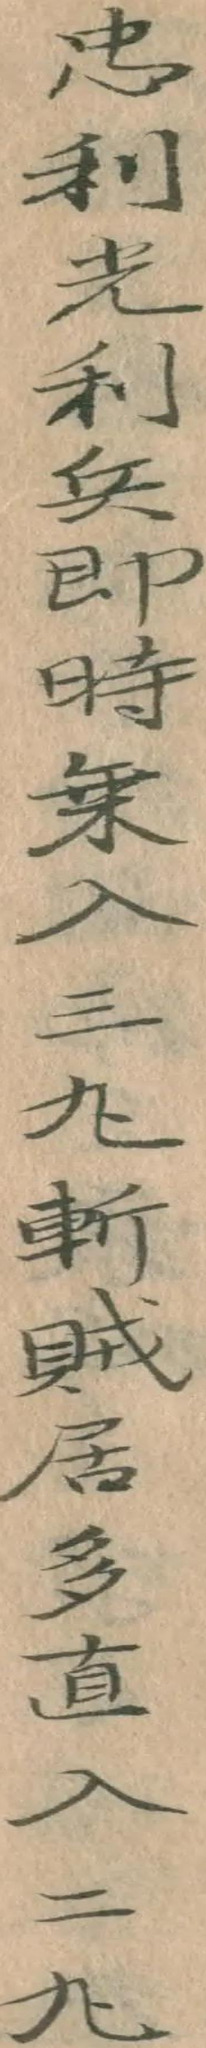忠利光利兵即時乗入三丸斬賊居多直入二丸
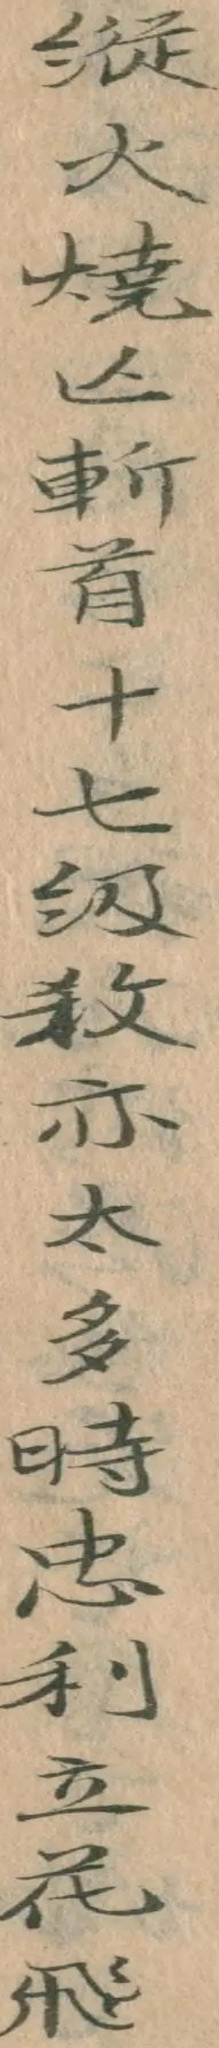縦火焼凶斬首十七級殺亦太多時忠利立花飛
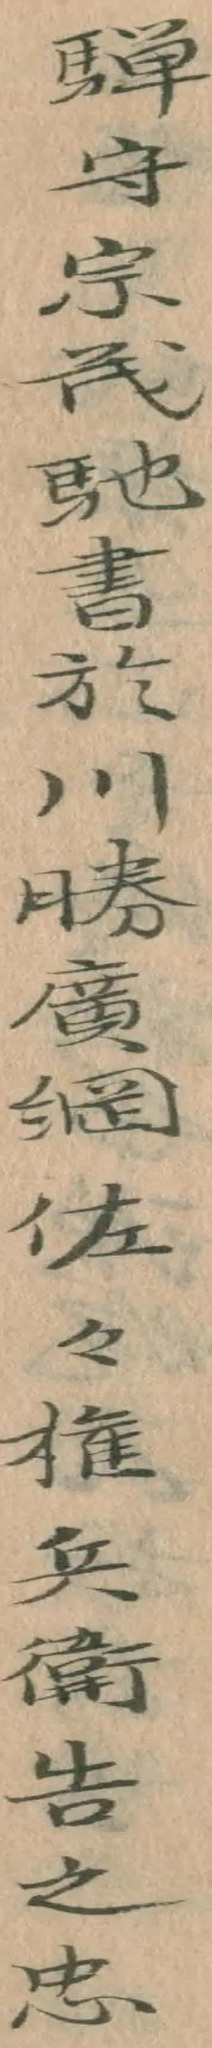騨守宗茂馳書於川勝広綱佐々権兵衛告之忠
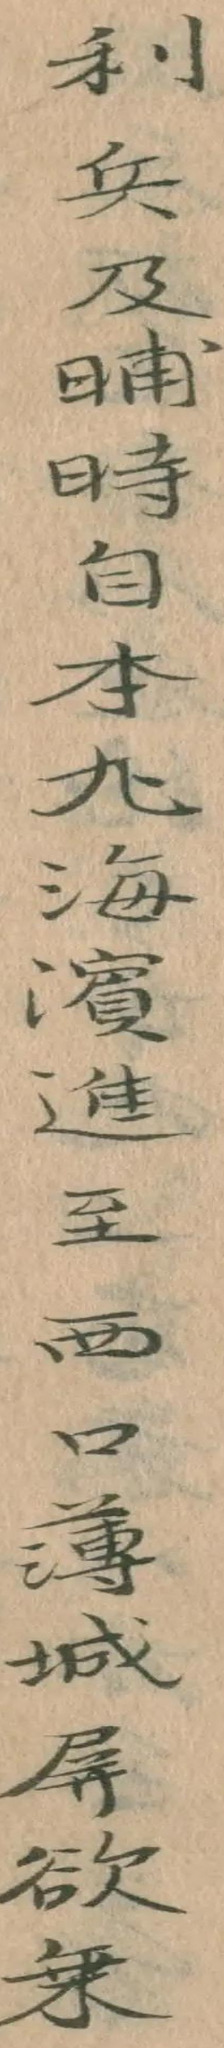利兵及晡時自本丸海浜進至西口薄城屏欲乗
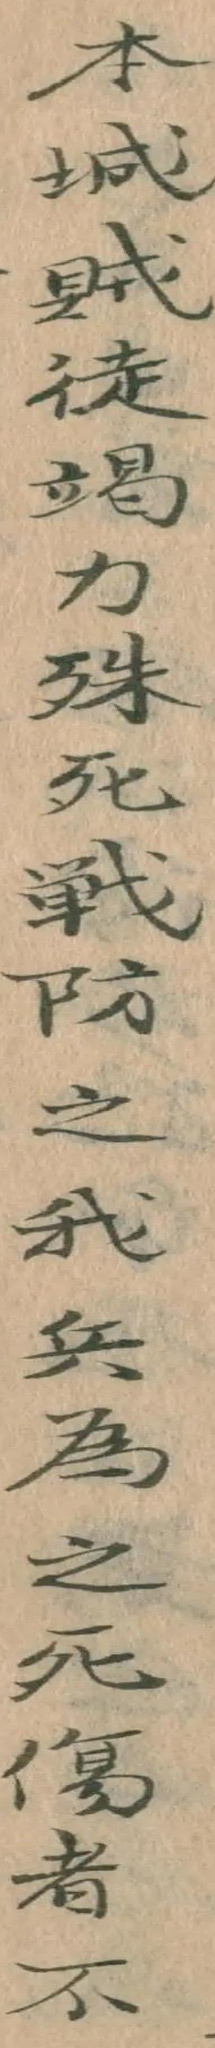本城賊徒竭力殊死戦防之我兵為之死傷者不
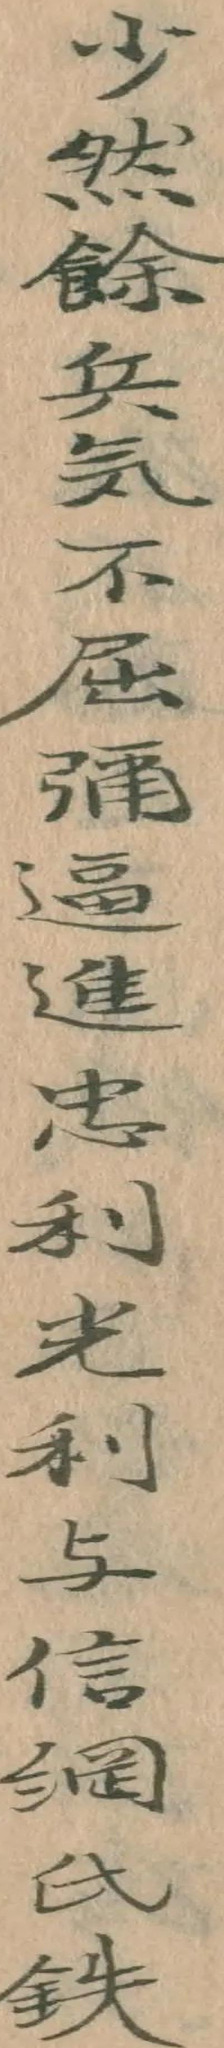少然余兵気不屈弥逼進忠利光利与信綱氏鉄
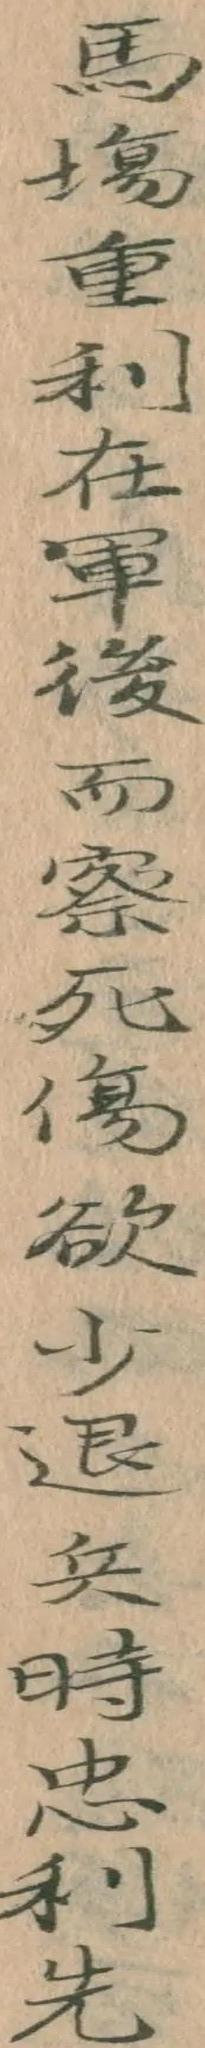馬場重利在軍後而察死傷欲少退兵時忠利先
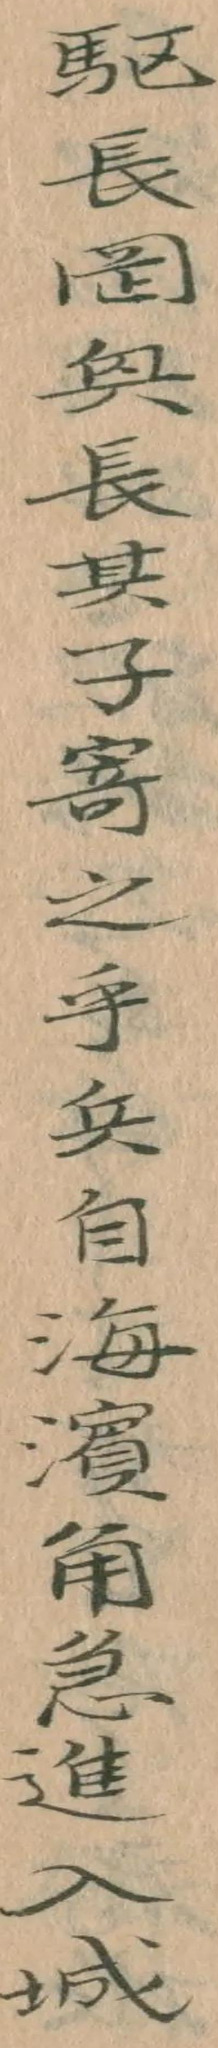駆長岡奥長其子寄之乎兵自海浜角急進入城
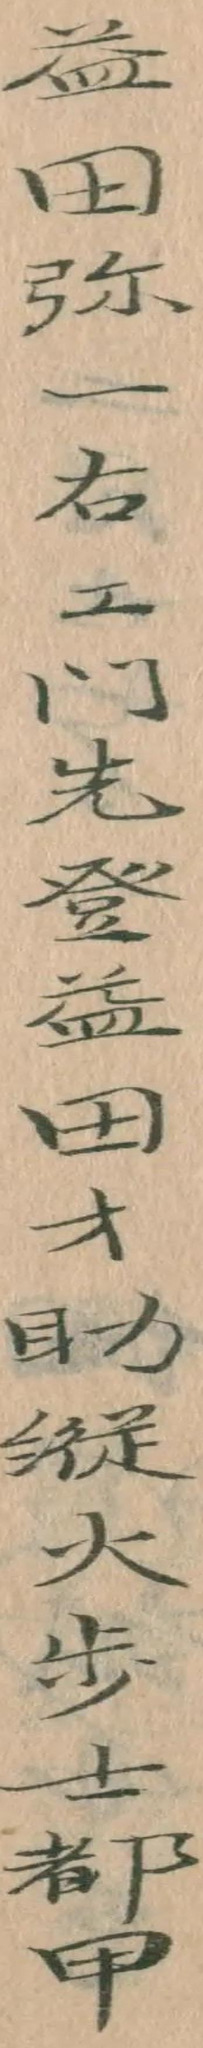益田弥一右衛門先登益田才助縦火歩士都甲
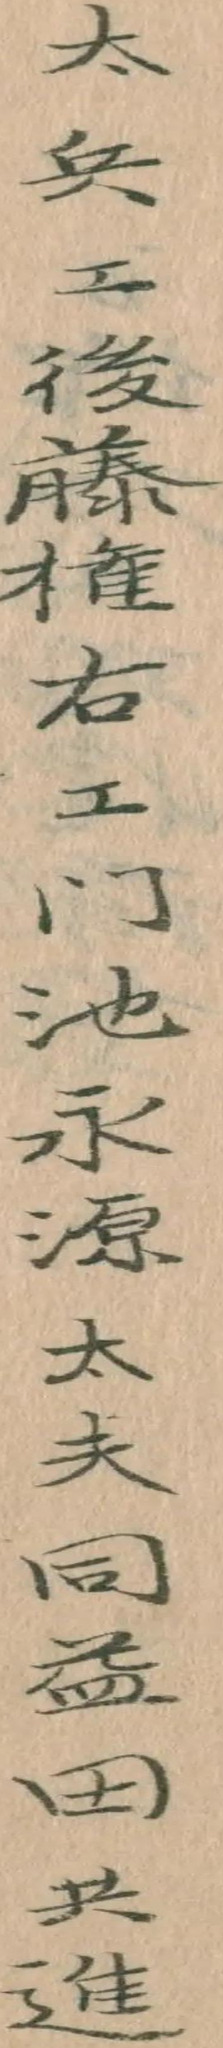太兵衛後藤権右衛門池永源太夫同益田共進
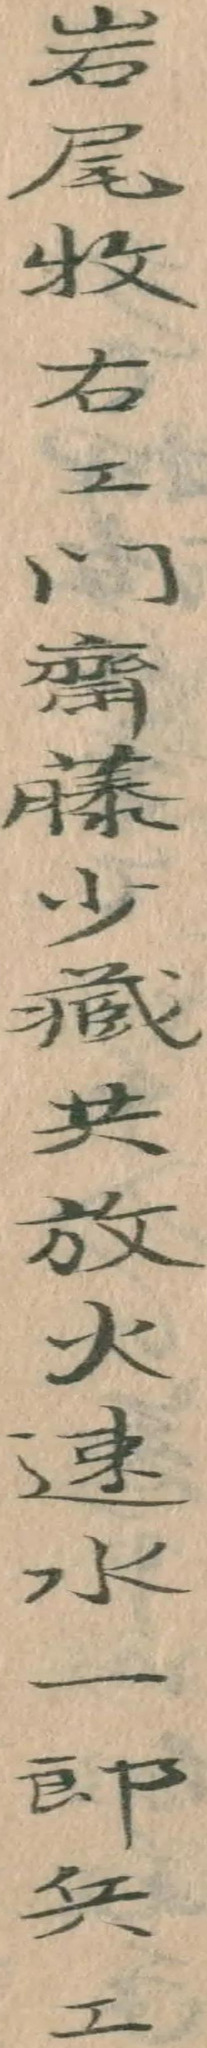岩尾牧右衛門斎藤少蔵共放火速水一郎兵衛
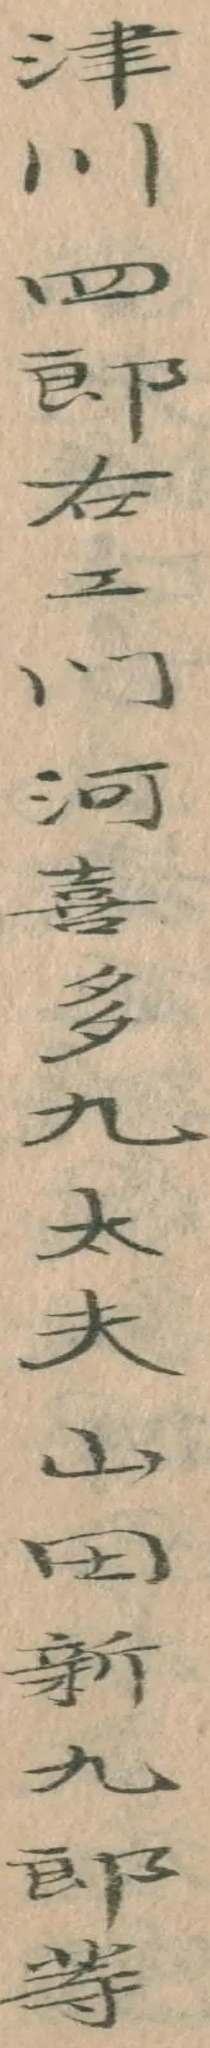津川四郎右衛門河喜多九太夫山田新九郎等
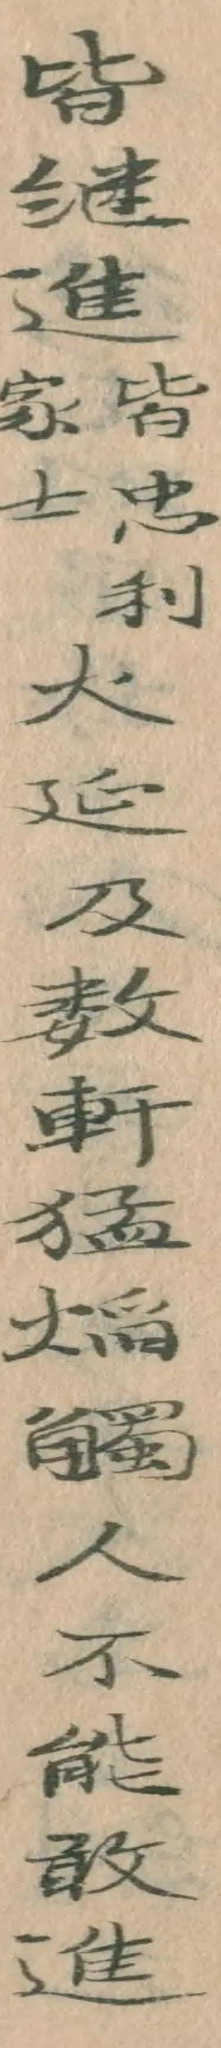皆継進皆忠利家士火延及数軒猛焔觸人不能敢進
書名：切支丹御退治記 49巻. [8]
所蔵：国立国会図書館 National Diet Library, JAPAN
